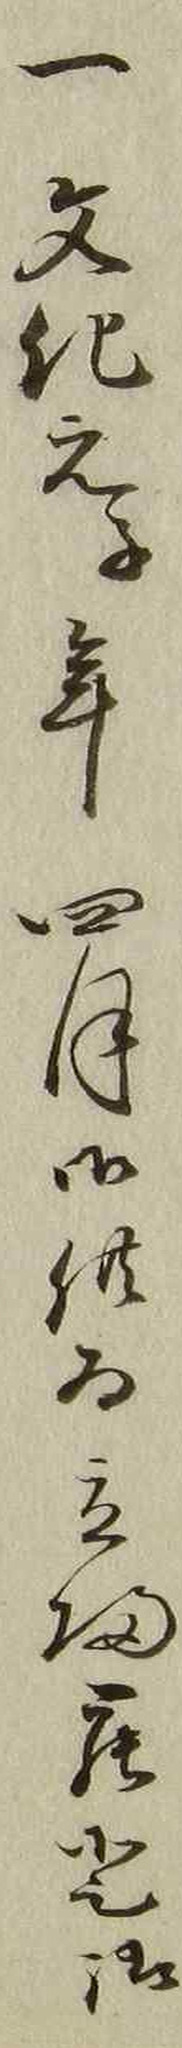一文化元子年四月御供為立帰罷登御
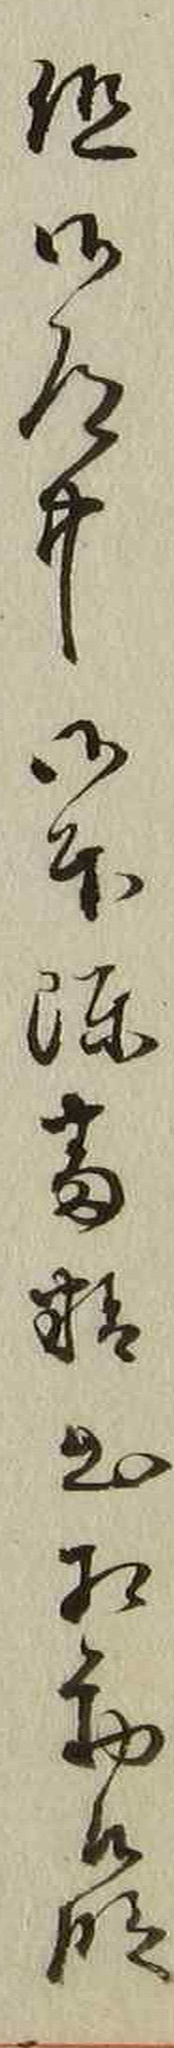但御道中御本陣番精出相勤候段
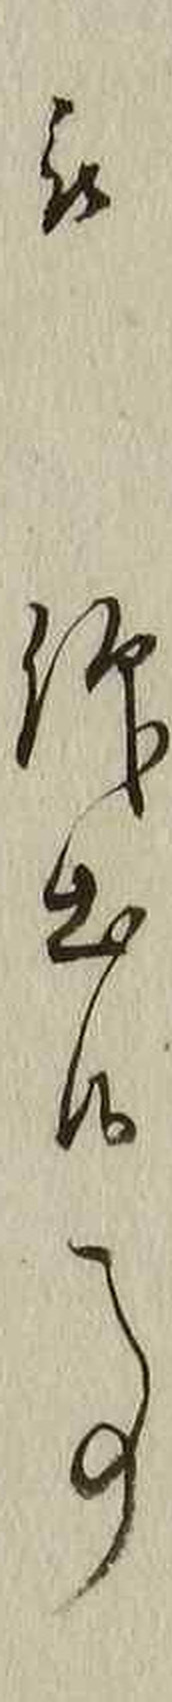被仰出候事
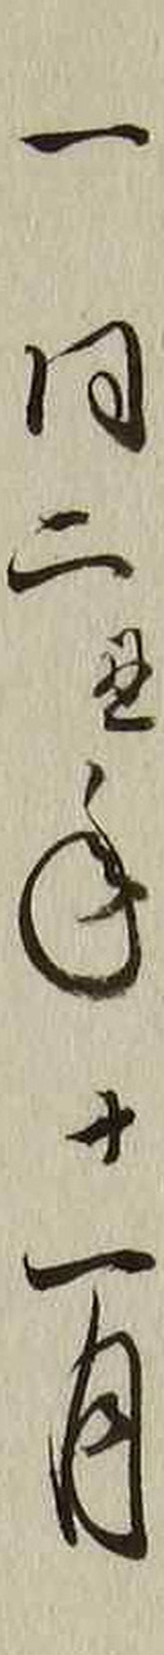一同二丑年十一月
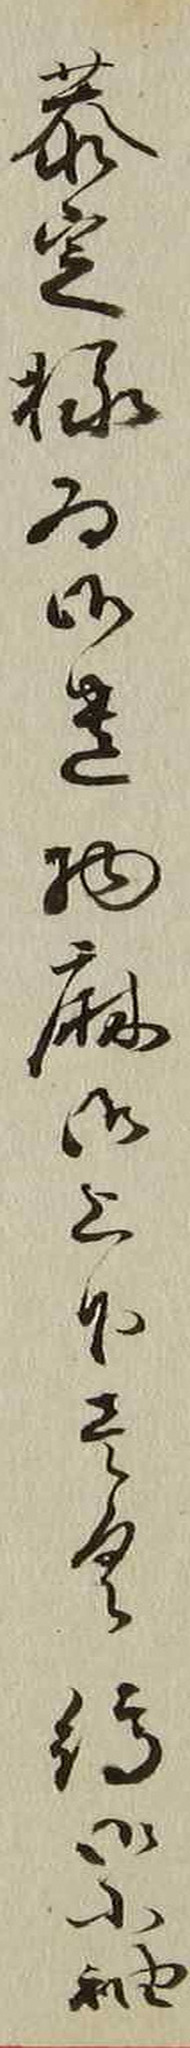恭定様為御遺物麻御上下壱具縞御小袖
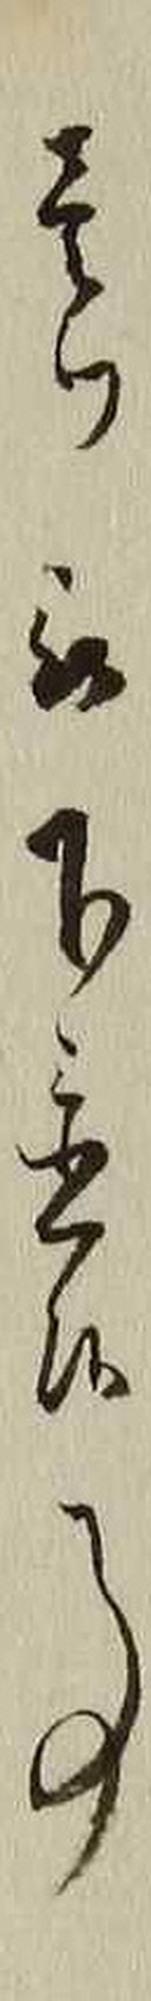壱ツ被下置候事
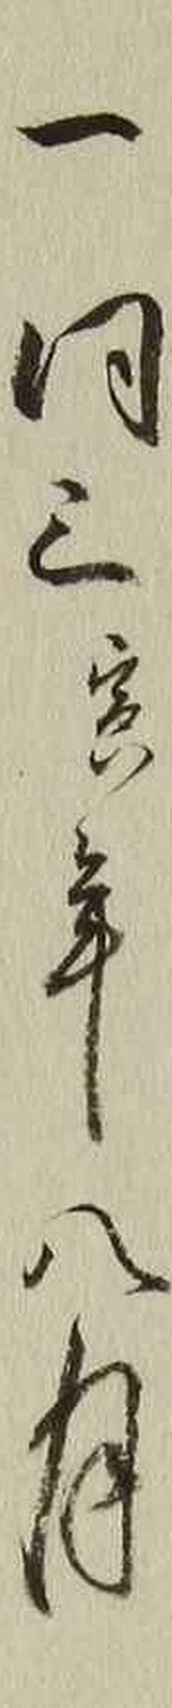一同三寅年八月
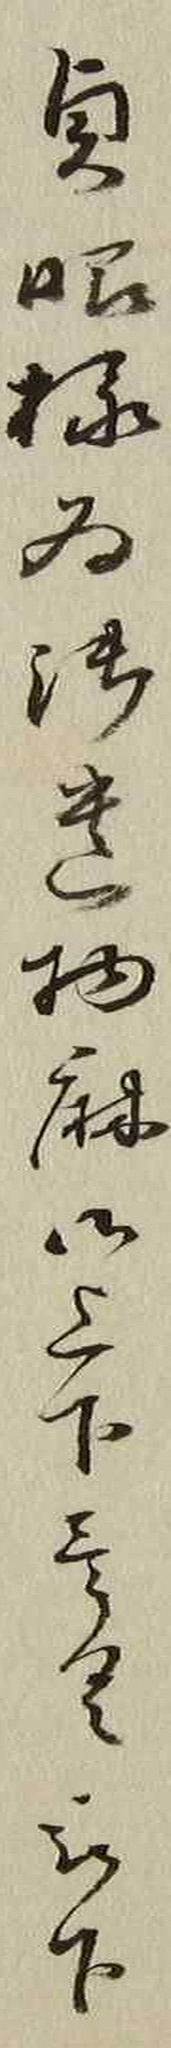貞昭様為御遺物麻御上下壱具被下
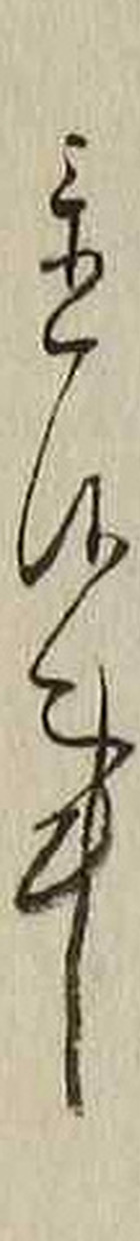置候事
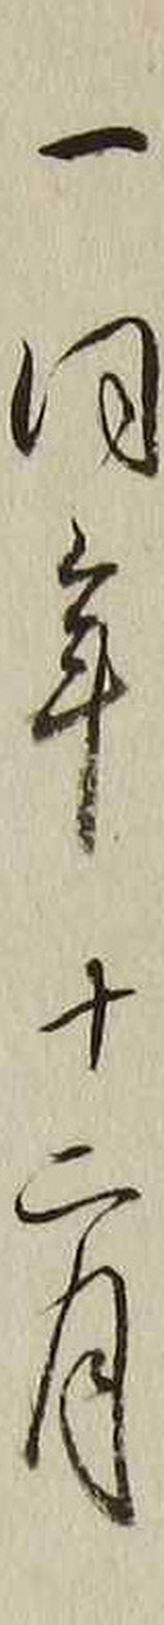一同年十二月
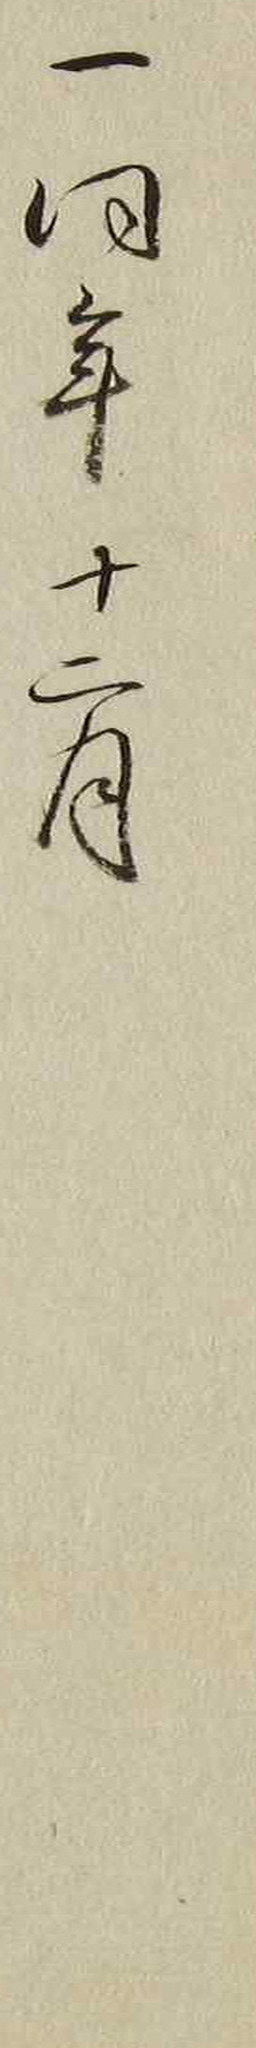一同年十二月
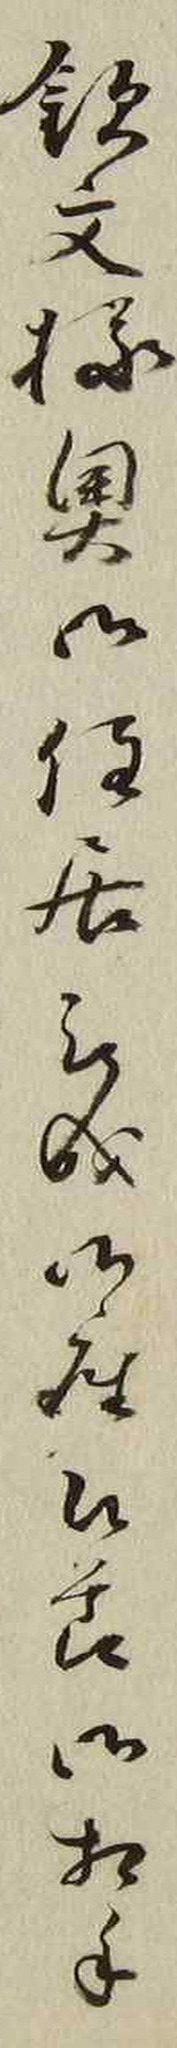欽文様奥御住居被成御座候節御相手
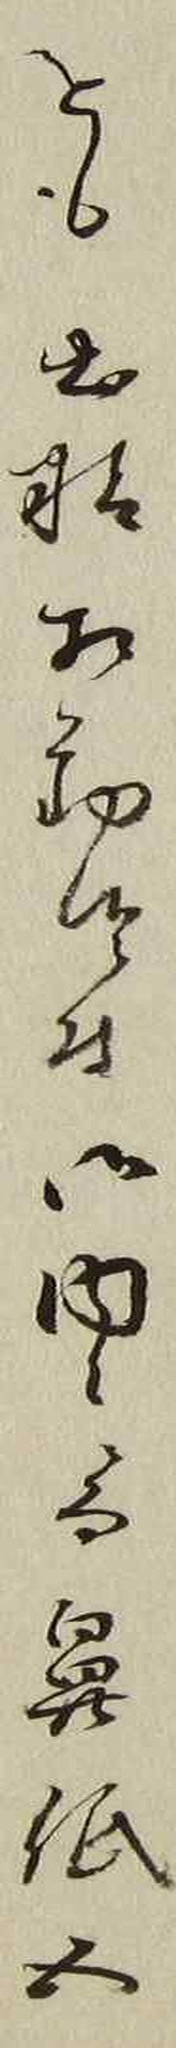とも出精相勤候ニ付御内々ニ而鼻紙五
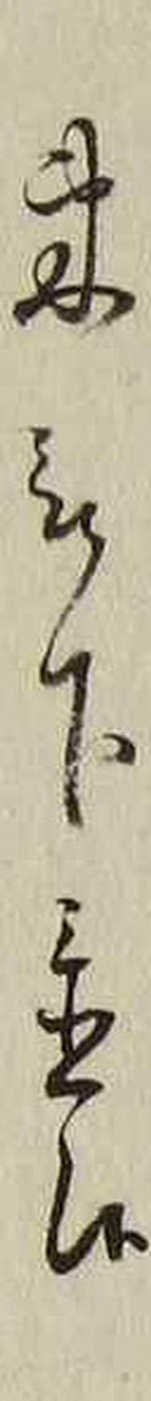束被下置候
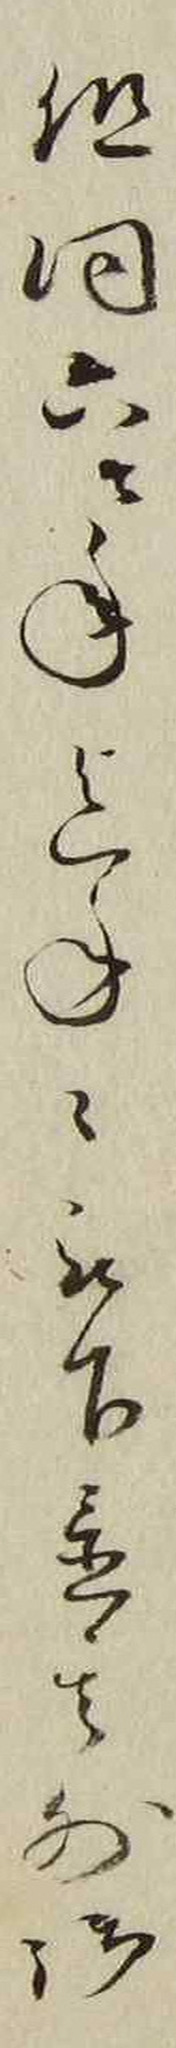但同六巳年迄年々被下置候其外御
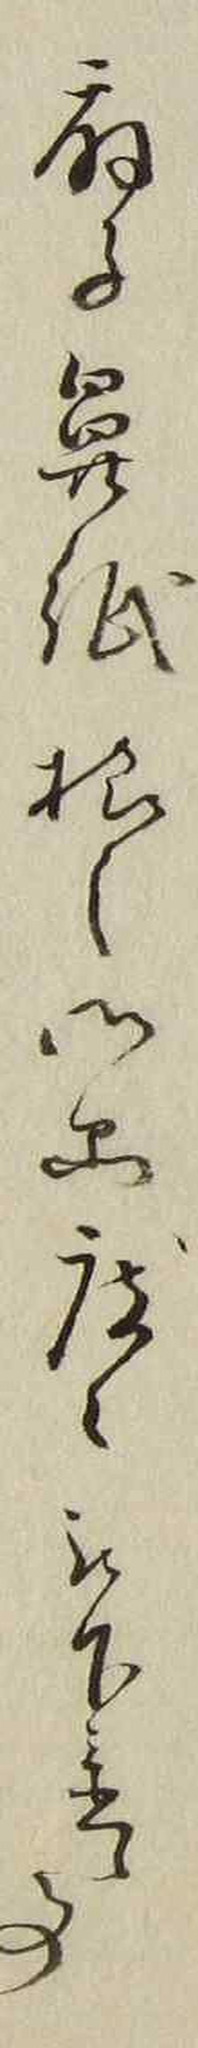扇子鼻紙様之御品度々被下置候事
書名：諸士系譜　巻之4　い之部4
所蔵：会津若松市立会津図書館
